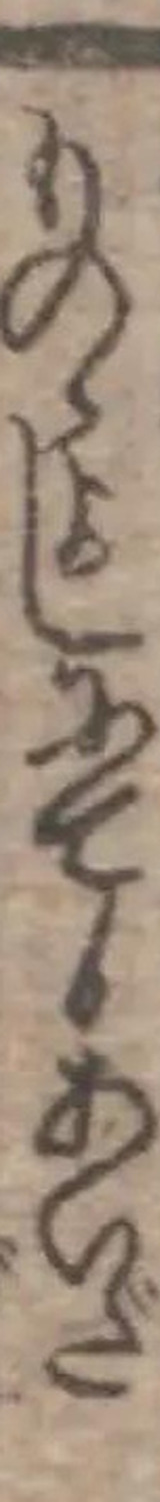ものゝよしにて候あいだ
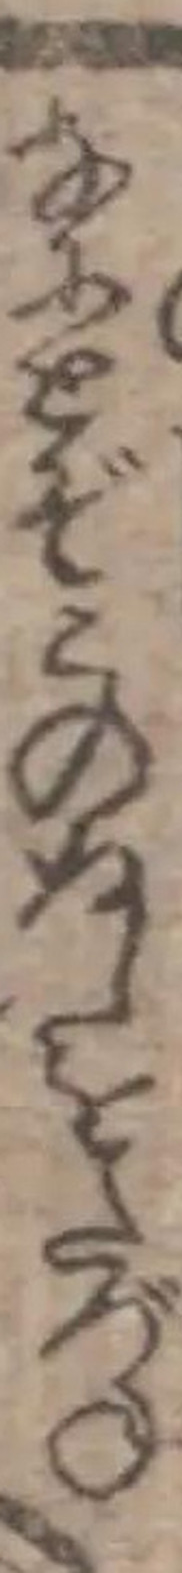なにとぞこのぬしをたづね
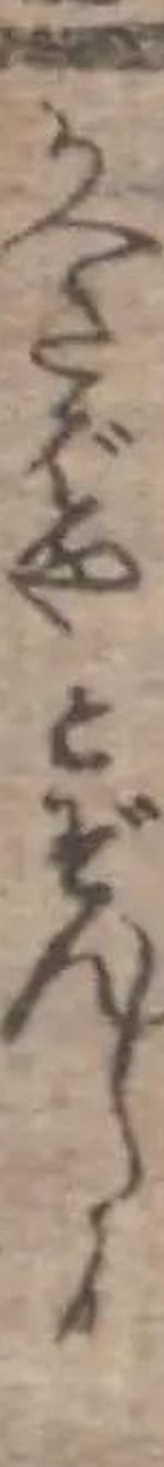かへたばやとぞんし候
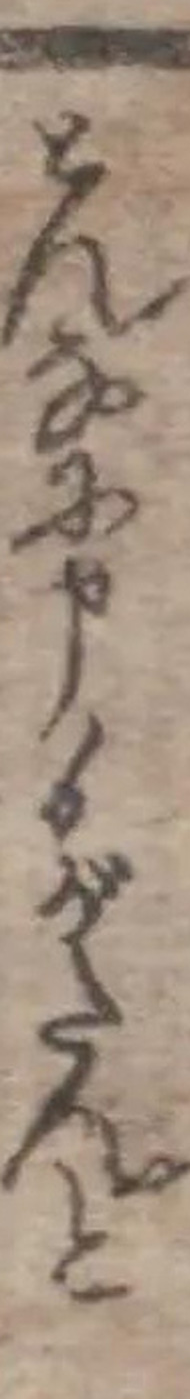とんなに申し候がたんと
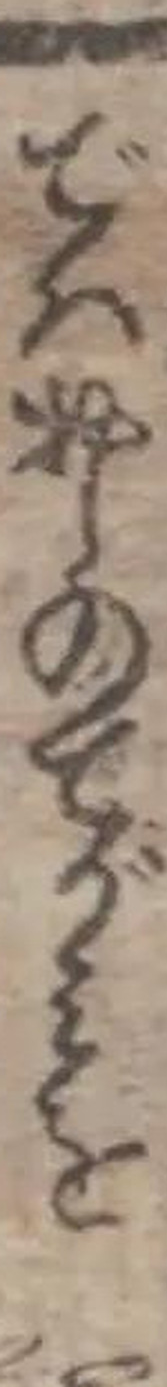でハおしのてがミを
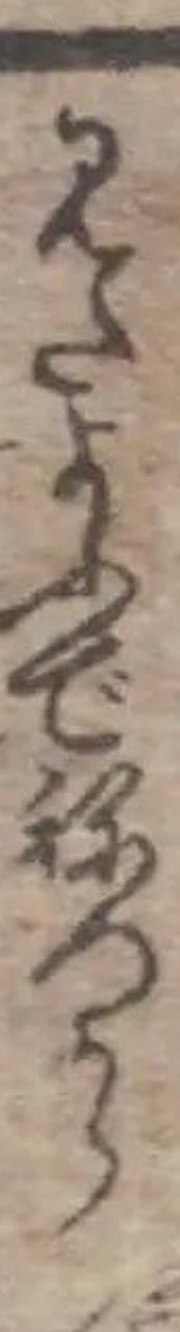見たようふでねつから
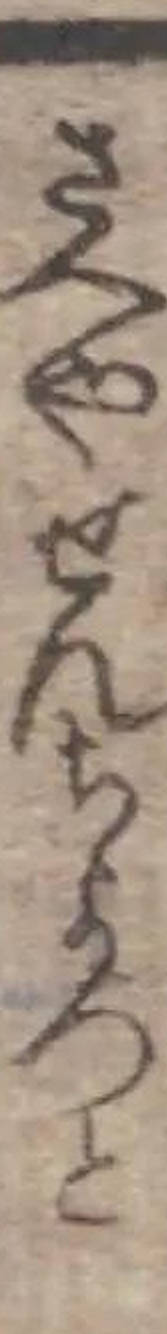さへやせんちよつと
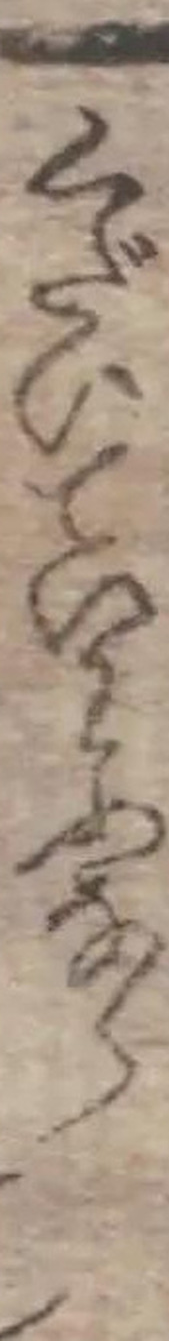くだいていわふなり
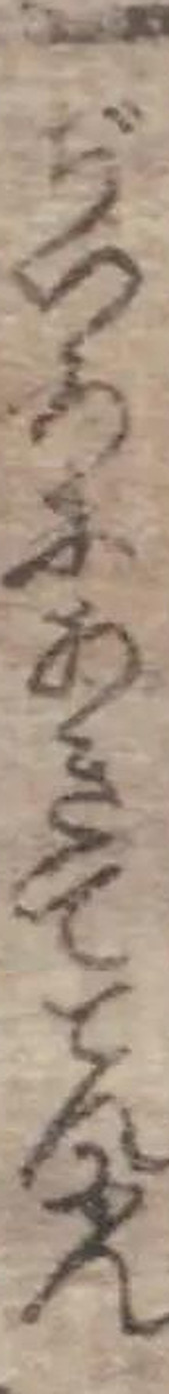ぢいろにあきててんにん
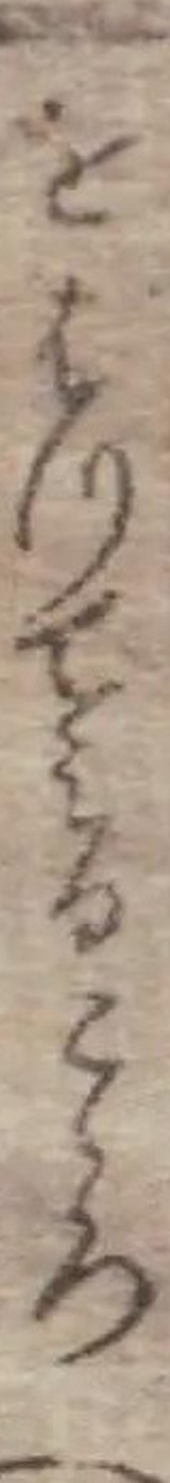をはつてミるこゝろ
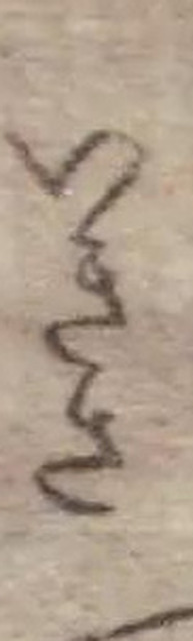いきさ

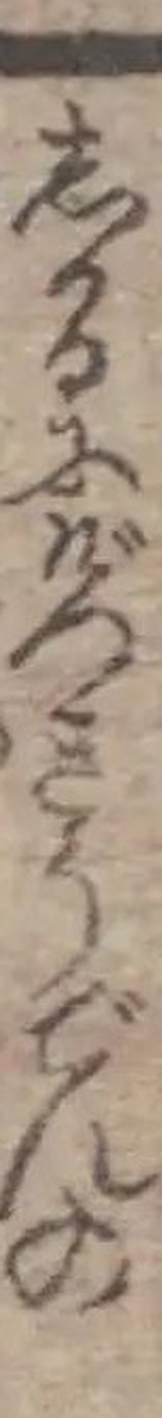しかるにげつきうでんの
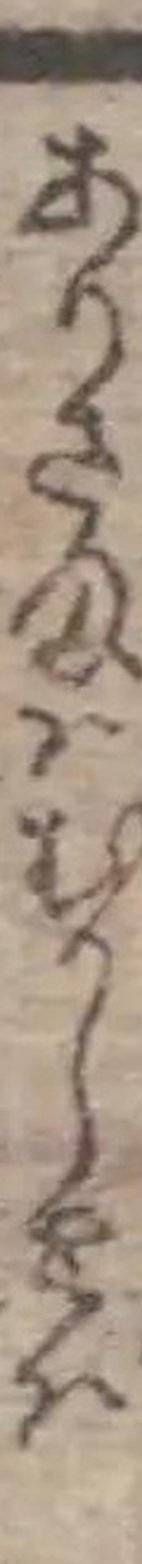ありさまハむかしとハ
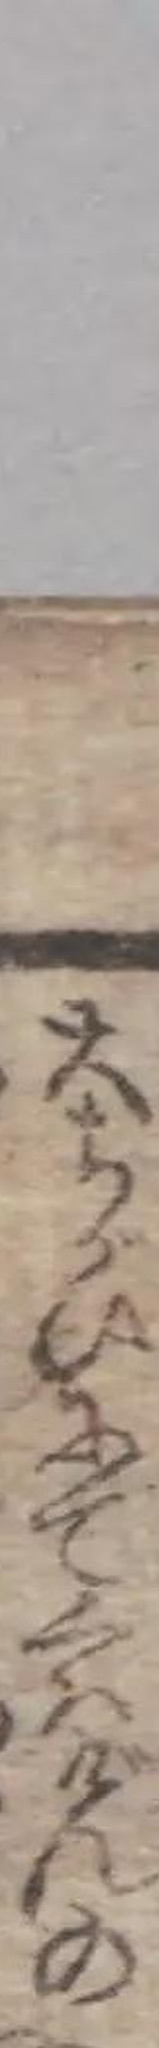大ちがひにてくハげんの
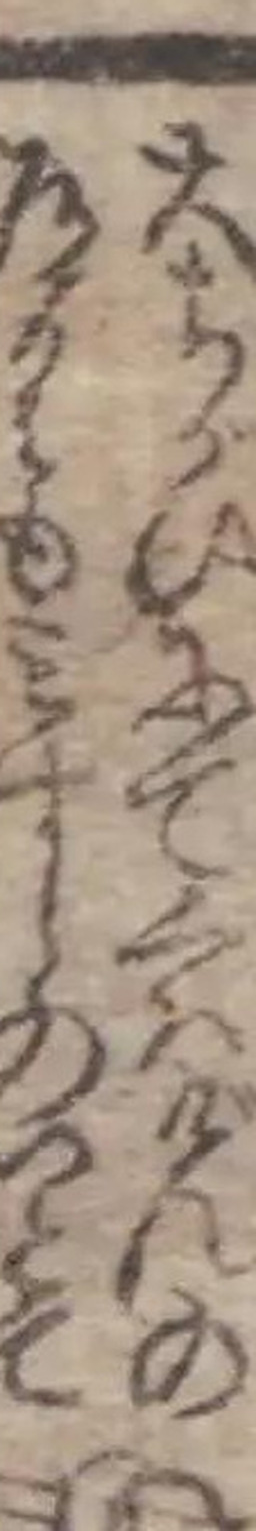道具もミすしのいとて
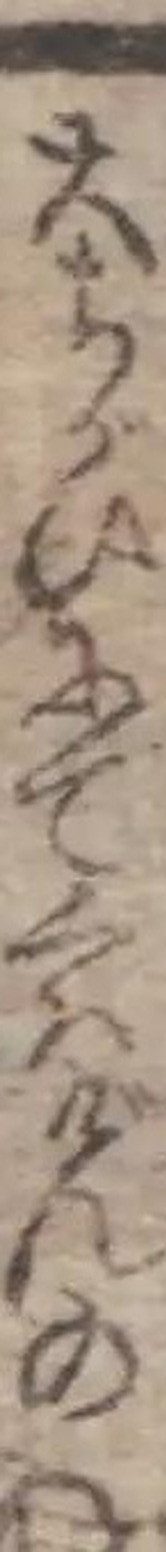大ちがひにてくハげんの
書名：草紙の曙 3巻
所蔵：国立国会図書館 National Diet Library, JAPAN
